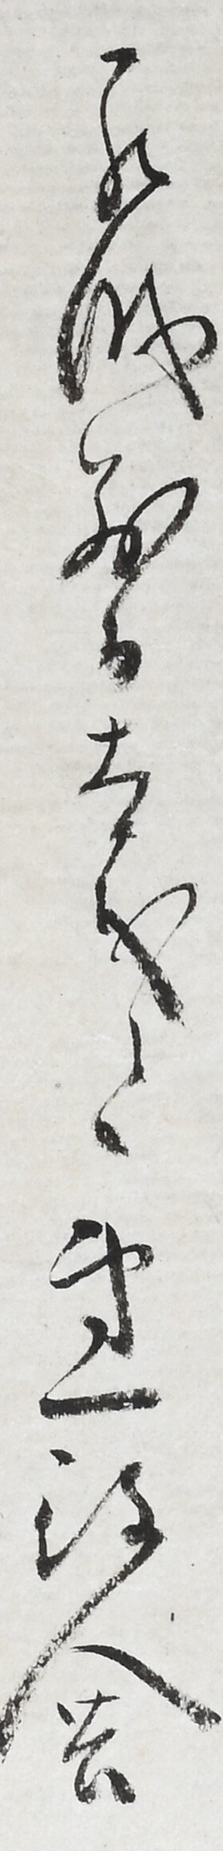罷越別而太義ニ候第一役人共
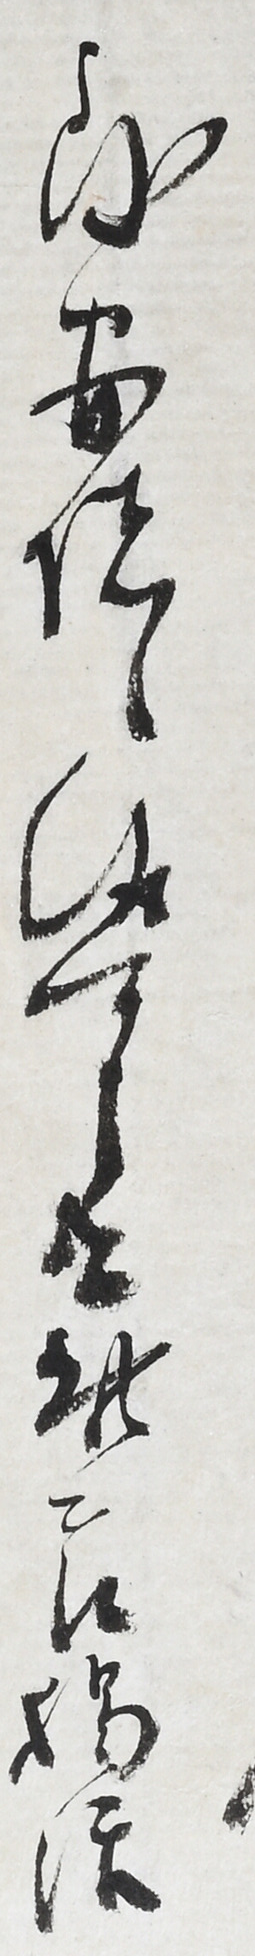致安堵候趣可申候此節独活
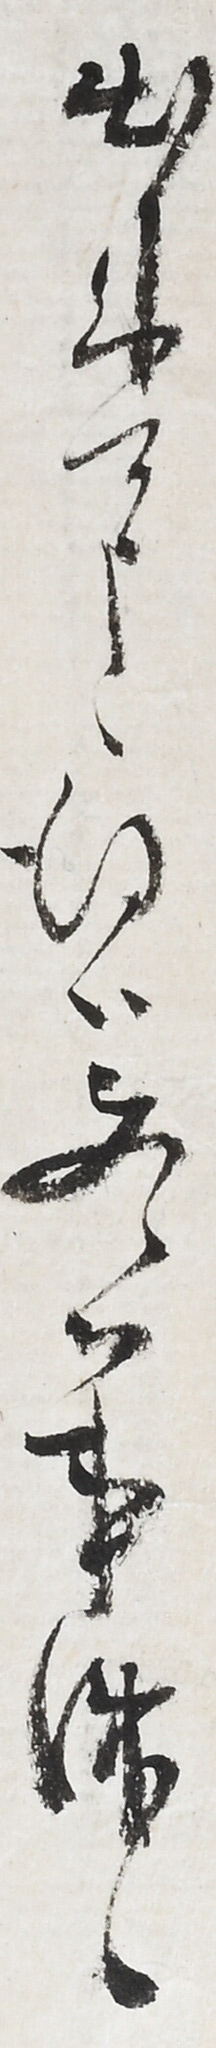出来可申候得ハ夫ニ而事済候
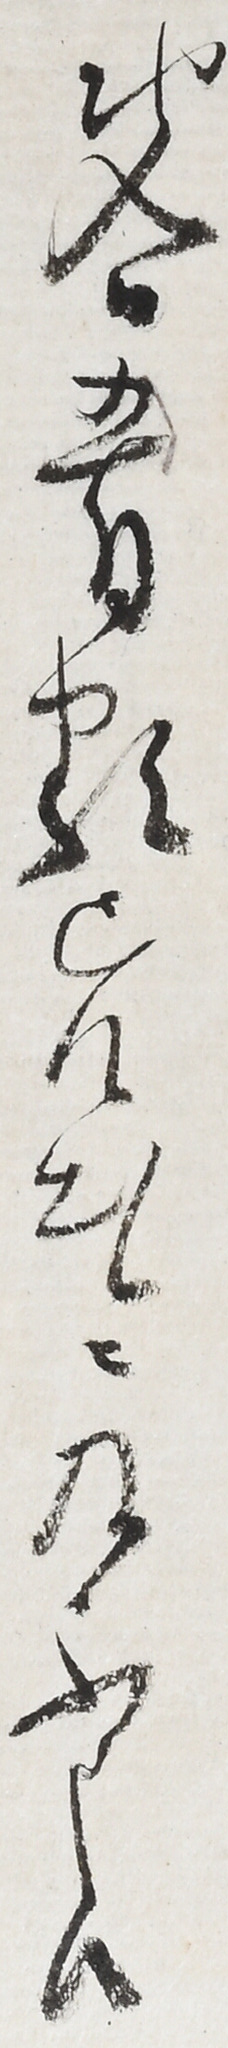決而肴類差出候ニ及不申候
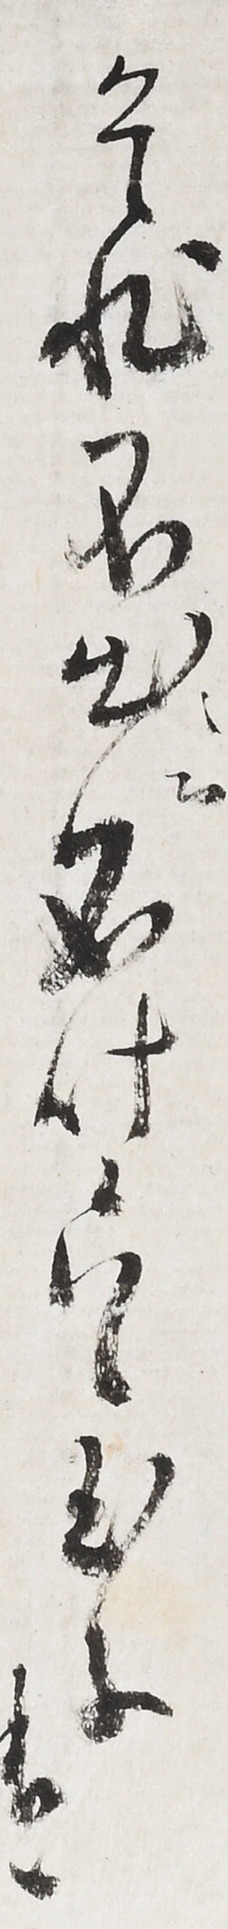是非不出ニ而不叶候ハゝ玉子能候
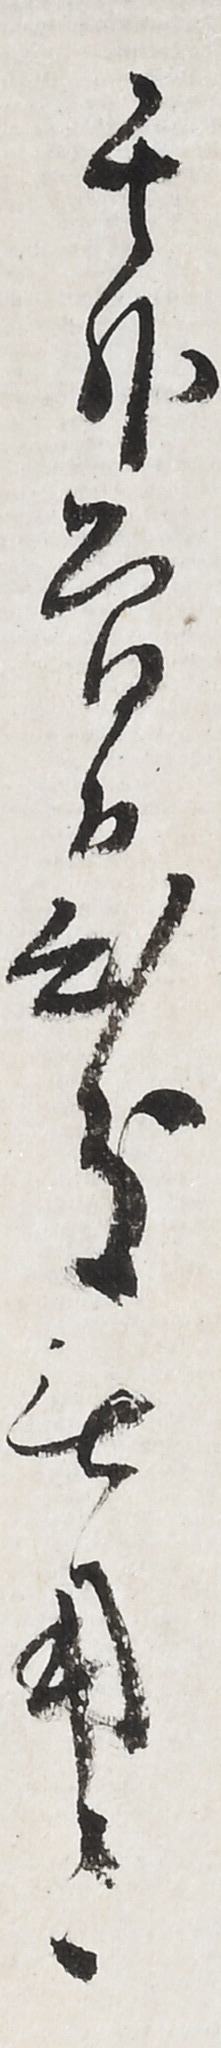其外曽而心支無用ニ候
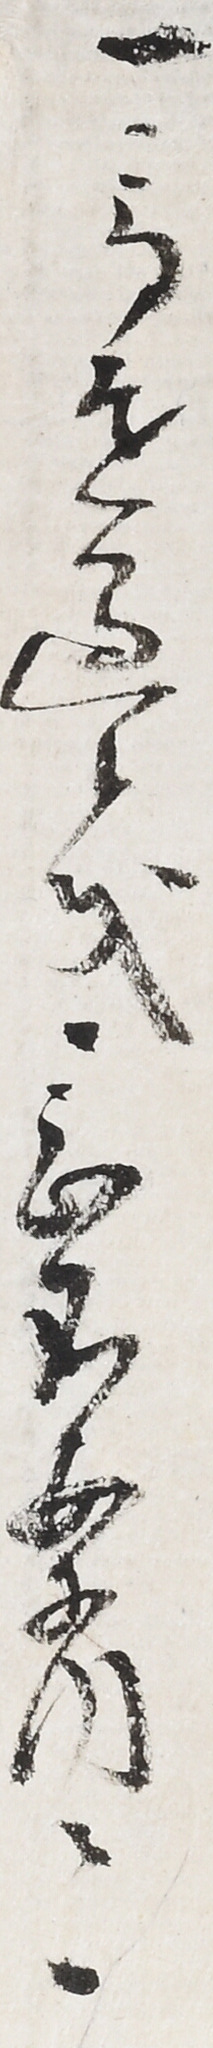一高遠過之義甚不案内ニ候
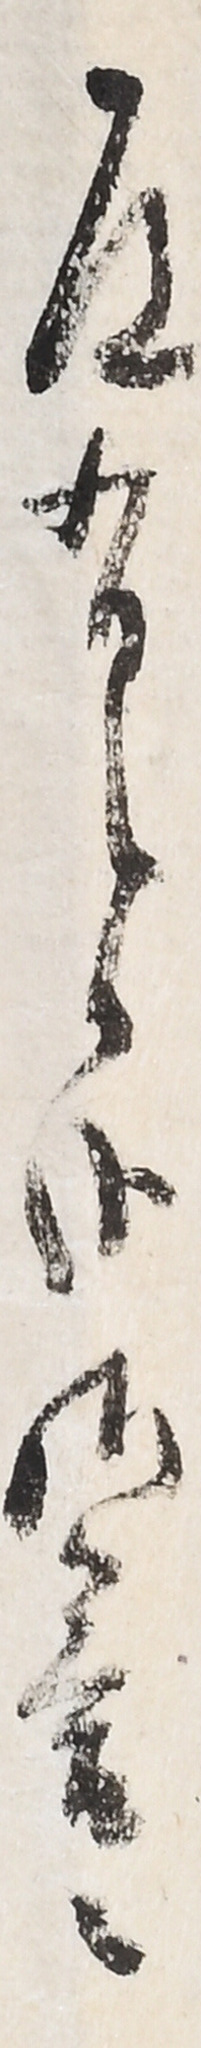道有之候哉御答ニ
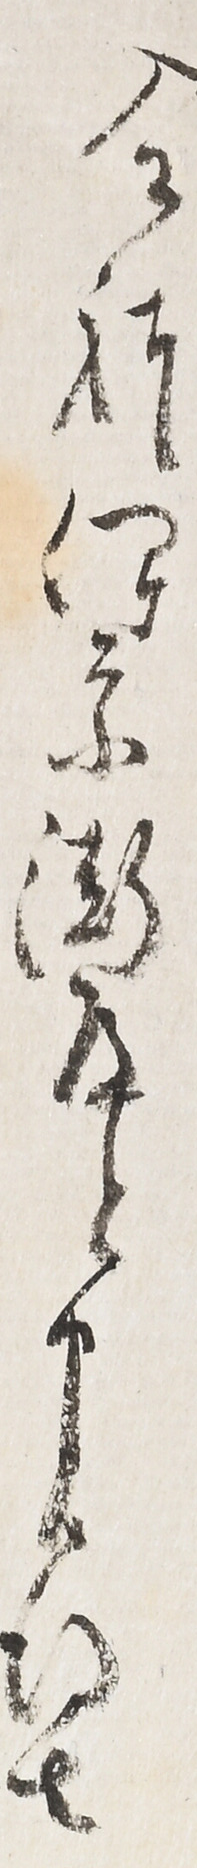全体伊奈街道と申候得は
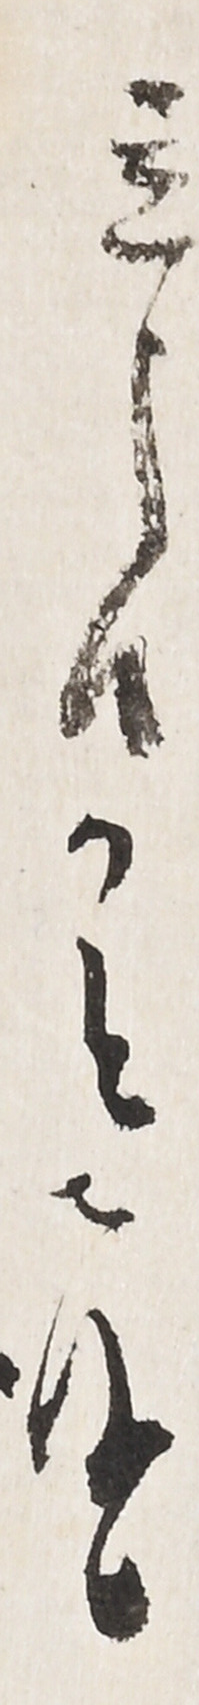立申候かと奉存候
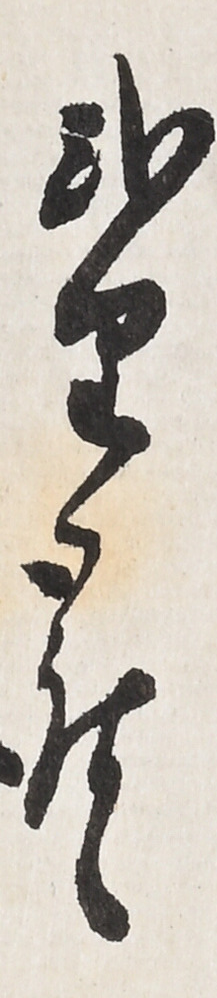弐里御座候
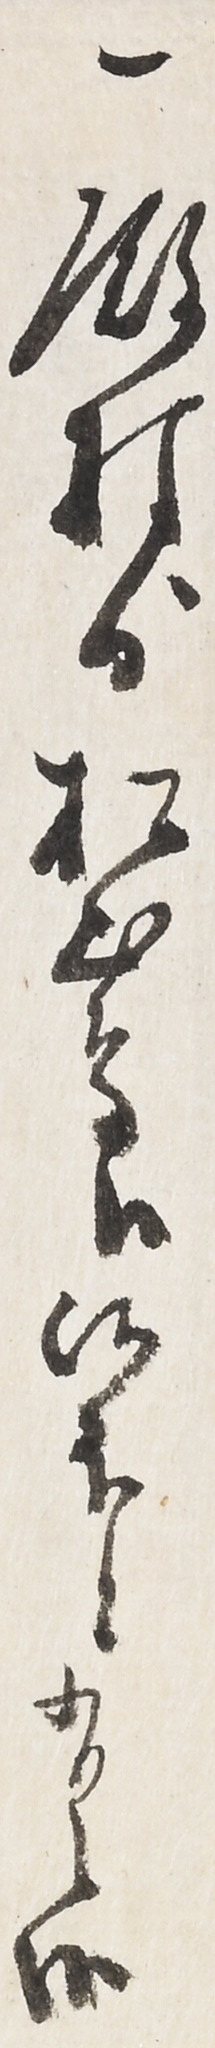一殿村ゟ松嶋え何ほと有之候哉
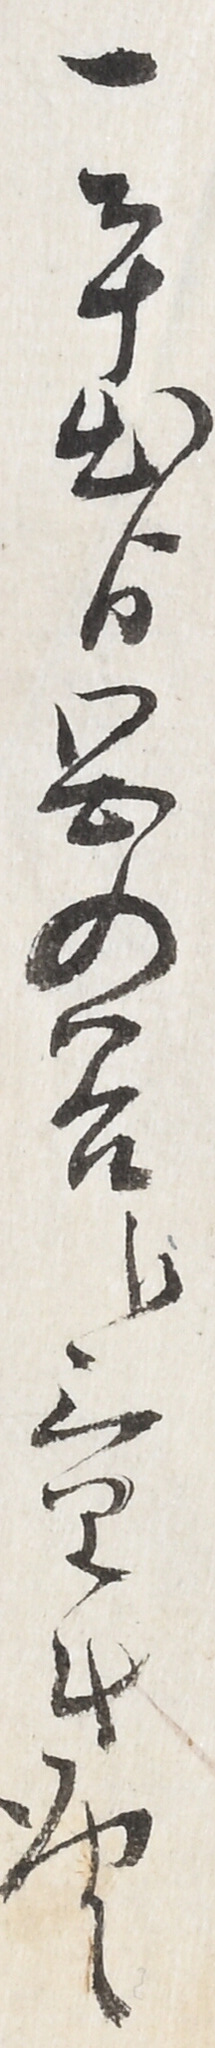一平出ゟ岡の谷え三里斗御座候
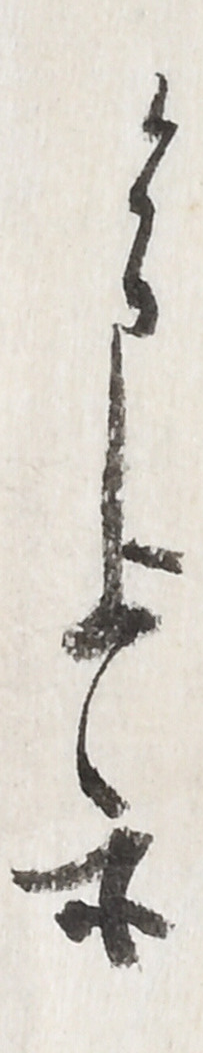と申上候所

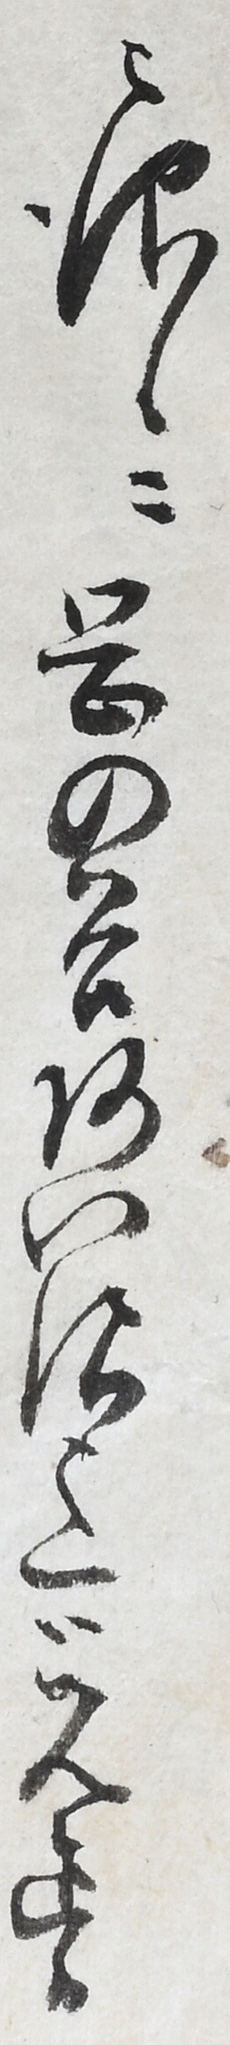被仰候ニ岡の谷あい沢迄ハ先達而
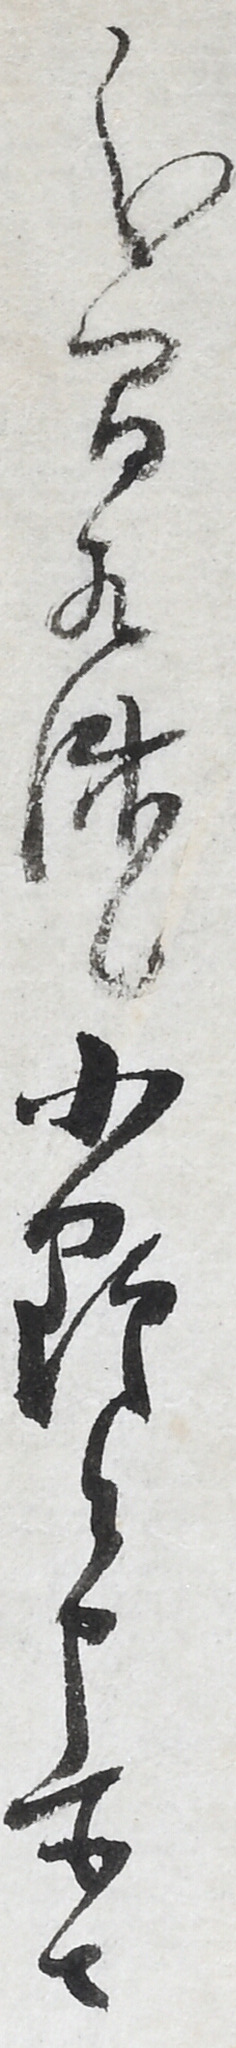分間相済候小野と申所は
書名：（覚書）
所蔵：伊那市立高遠町図書館・合同会社AMANE
